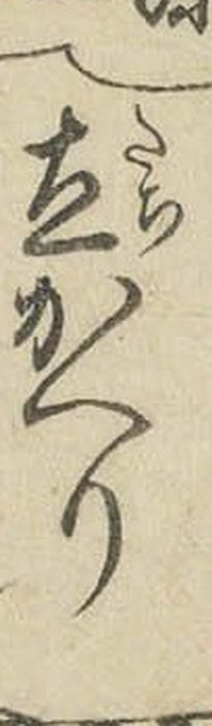立かへり
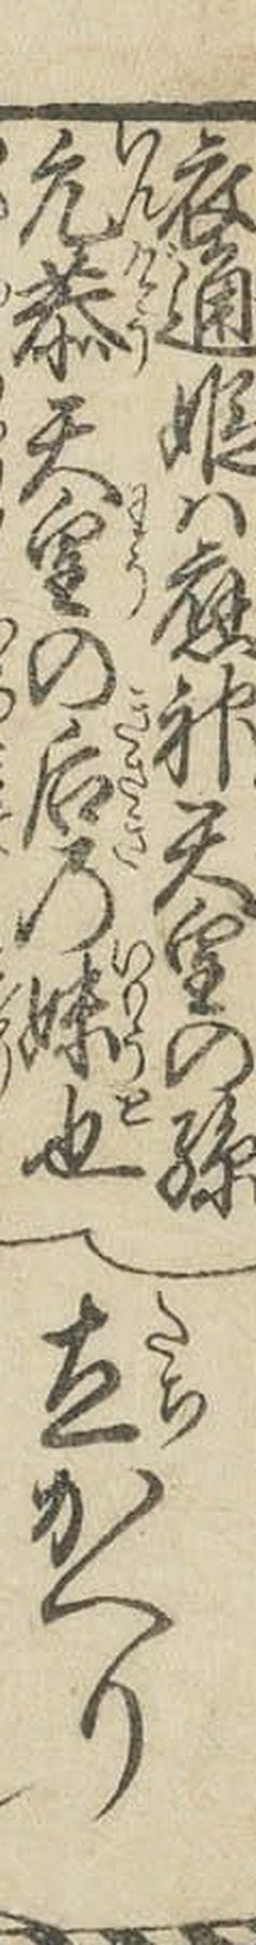允恭天皇の后の妹也
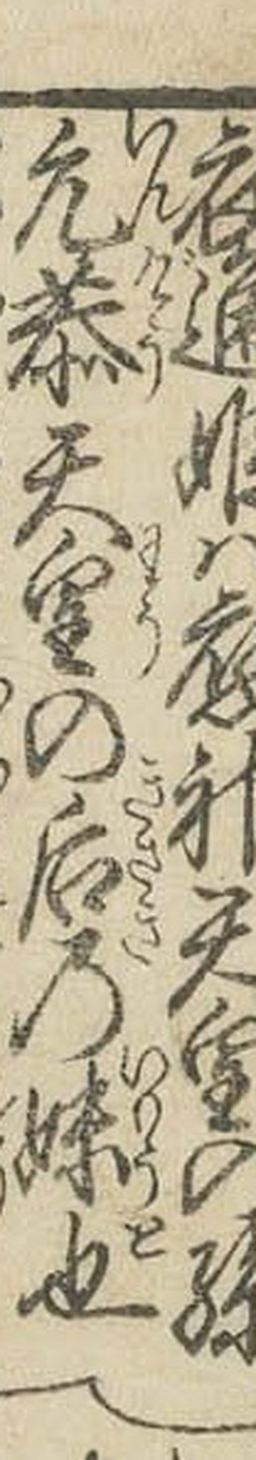允恭天皇の后の妹也
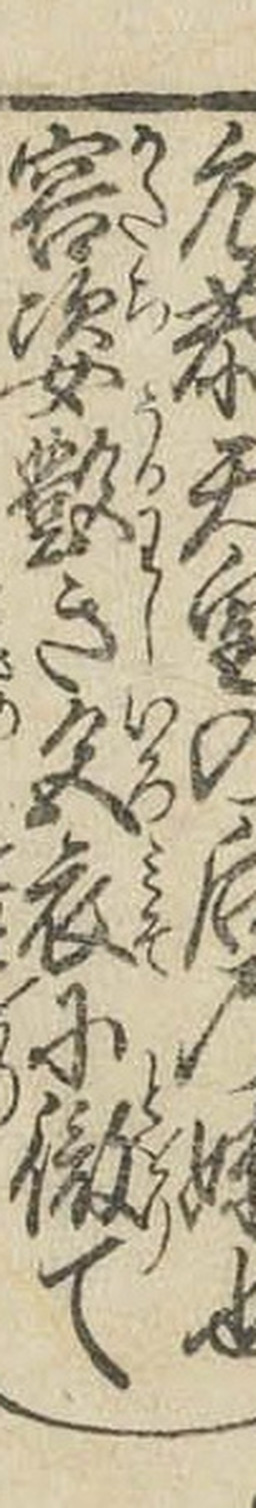容姿艶き色衣に徹て
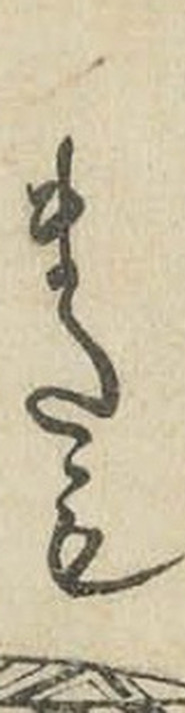またも
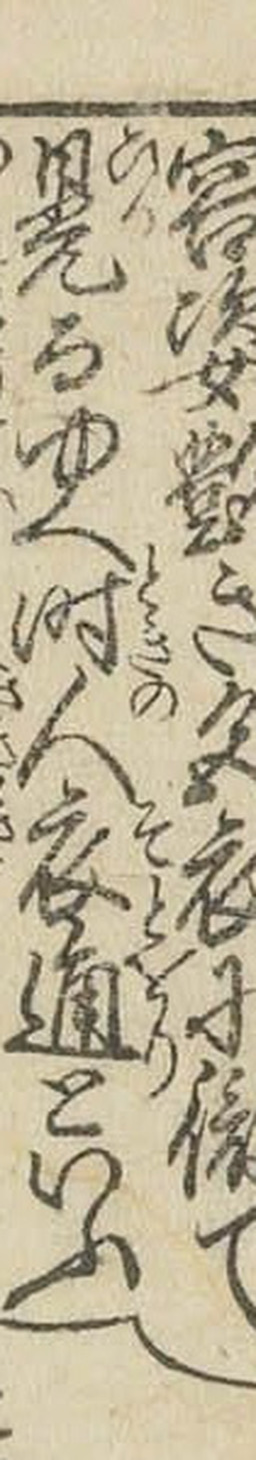晃るゆへ時人衣通といふ
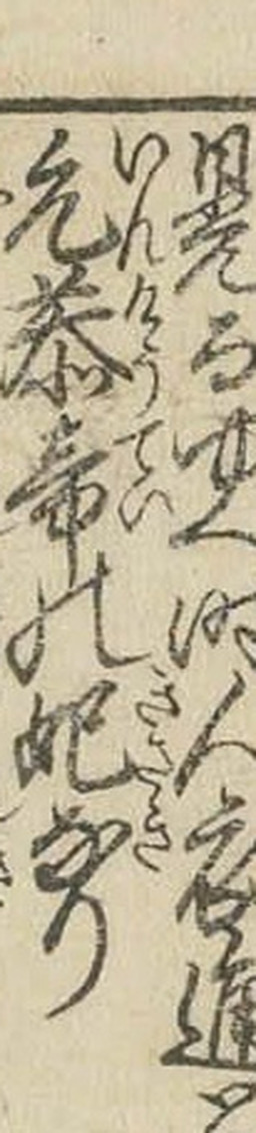允恭帝の妃なり
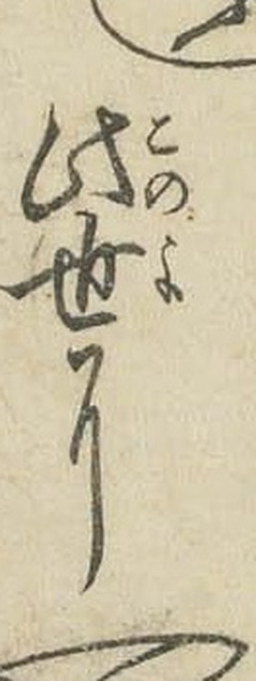此世に
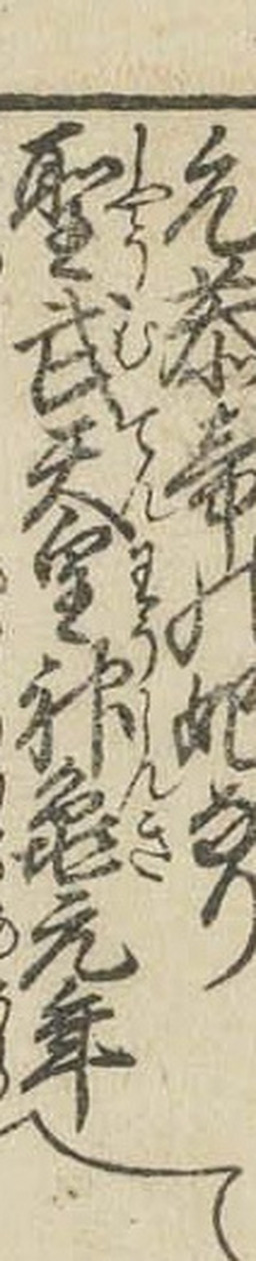聖武天皇神亀元年
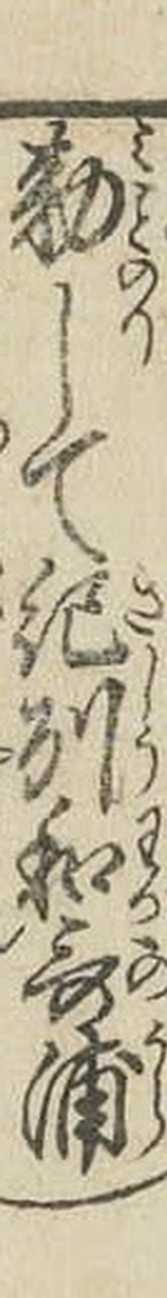勅して紀州和哥浦
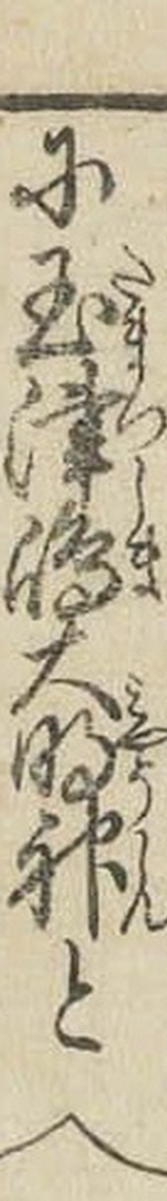に玉津嶋大明神と
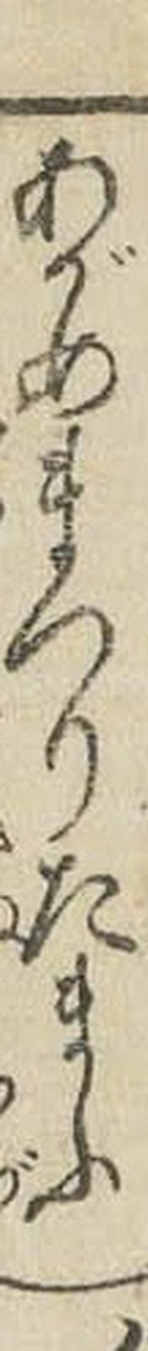あがめまつりたまふ
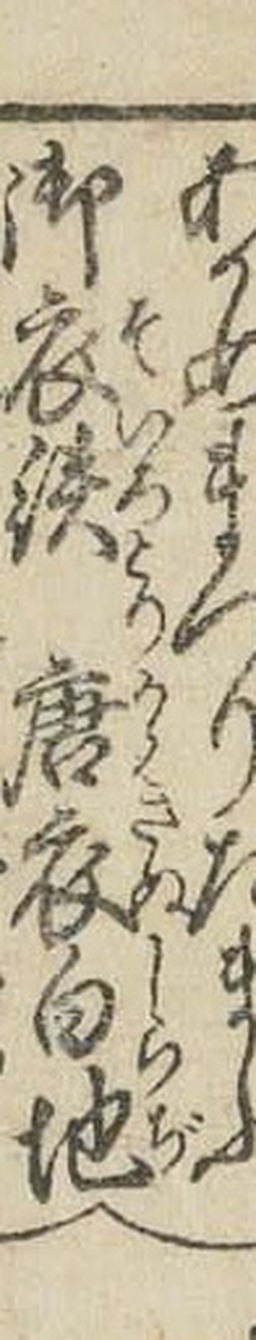御衣續唐衣白地
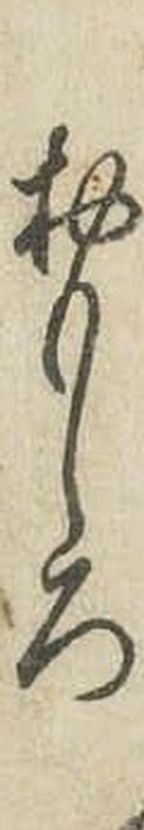おもしろ
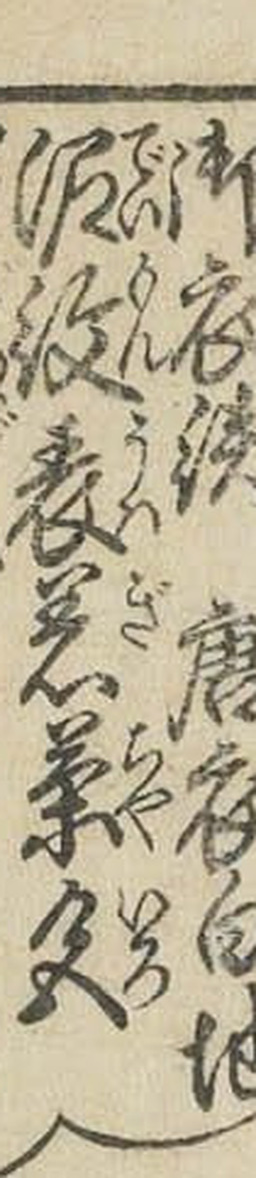泥紋表着茶色
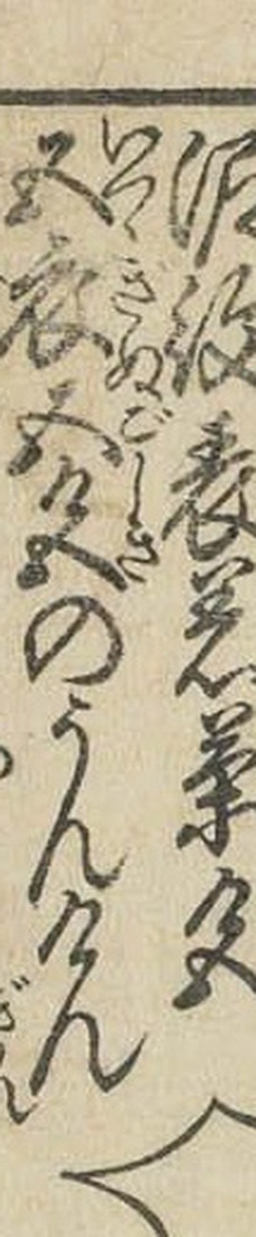五衣五色のうんけん
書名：絵本写宝袋 9巻 1之巻
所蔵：東京学芸大学教育コンテンツアーカイブ
